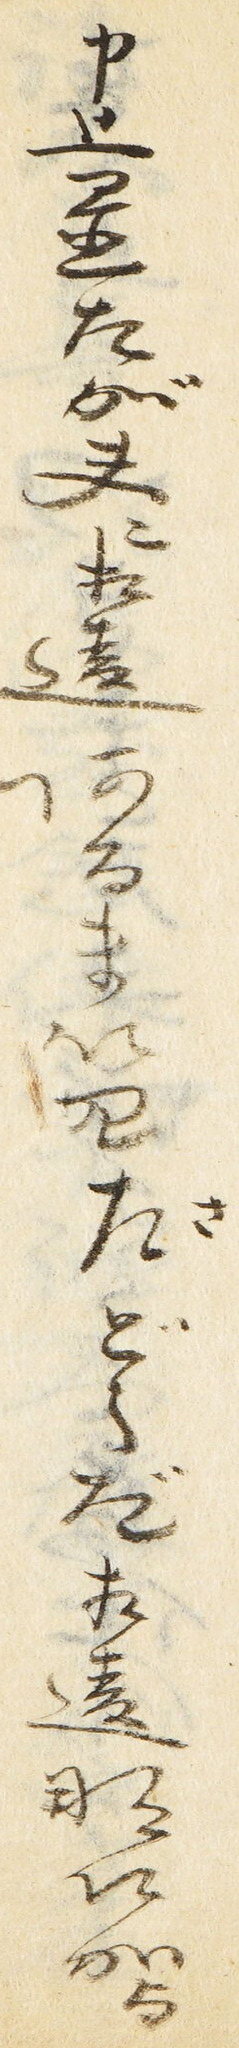申上置たが夫に相違あるまいわ左どうだ相違ないかと
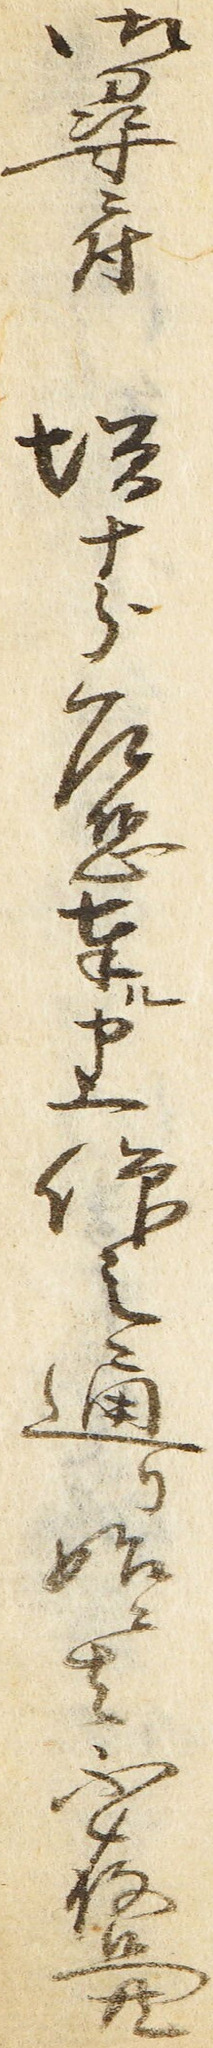御尋に付増十郎乍恐奉る申上仰之通り始には不存候へ共

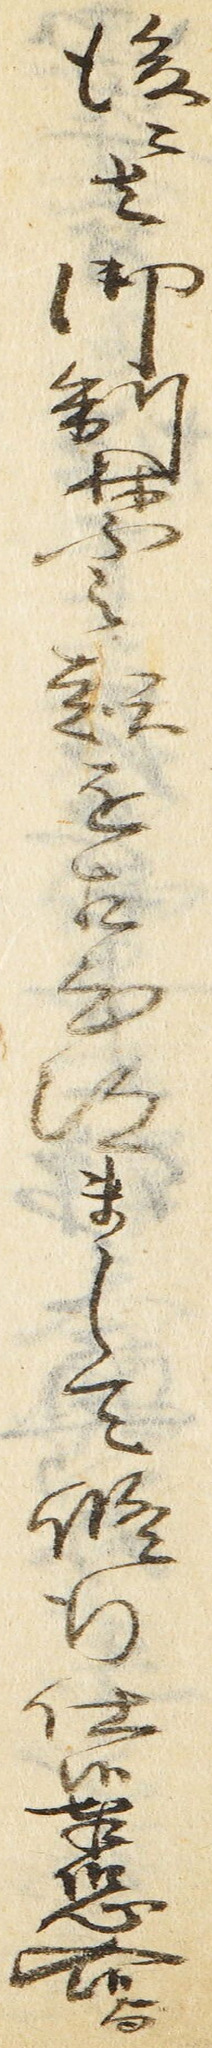後には御制禁之趣を相心得まして修行仕候奉恐入候と
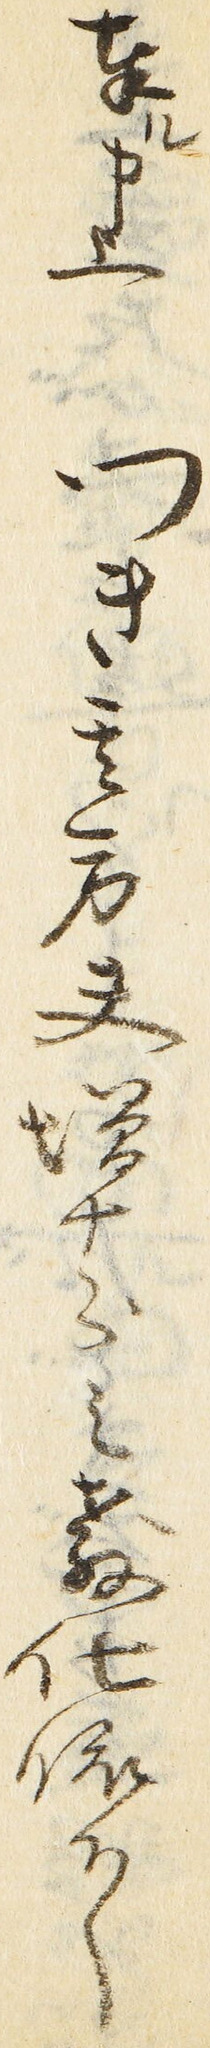奉る申上つき其方夫増十郎之教化依て
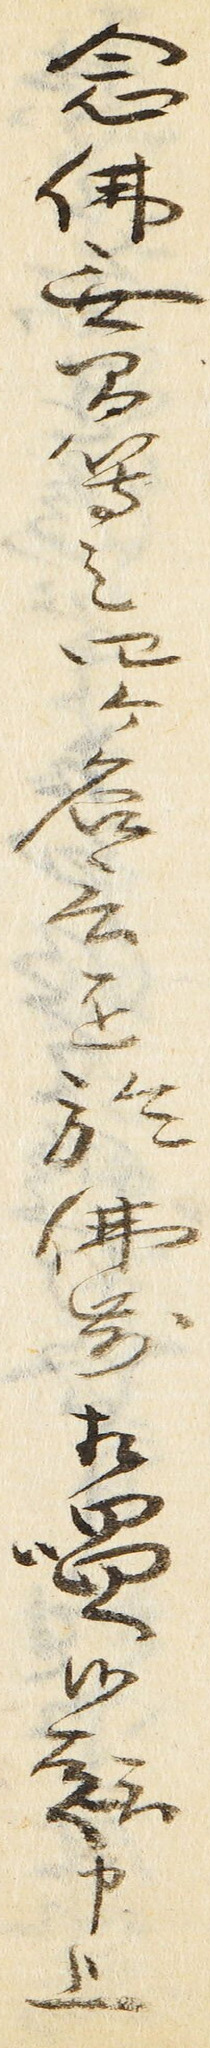念佛無間の四ケ名言を於仏前相唱へ候趣申上
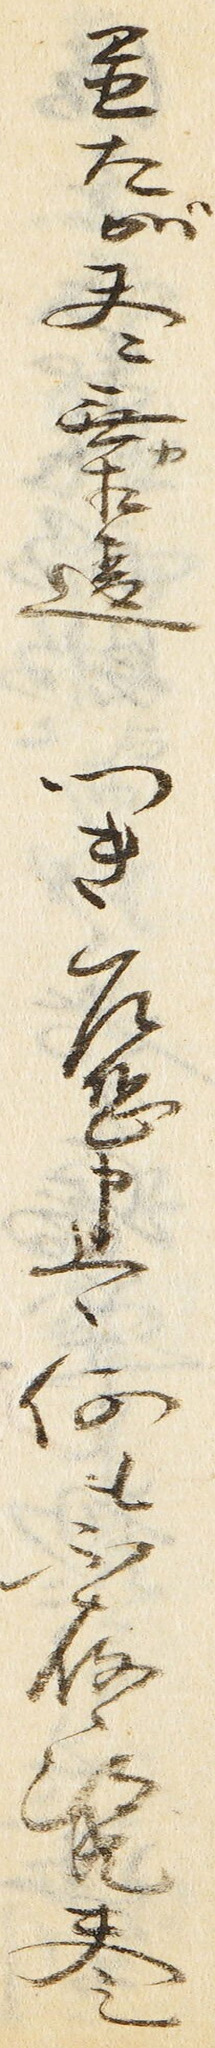置たが夫に無か相違つき乍恐申上候何も不存候得共夫之
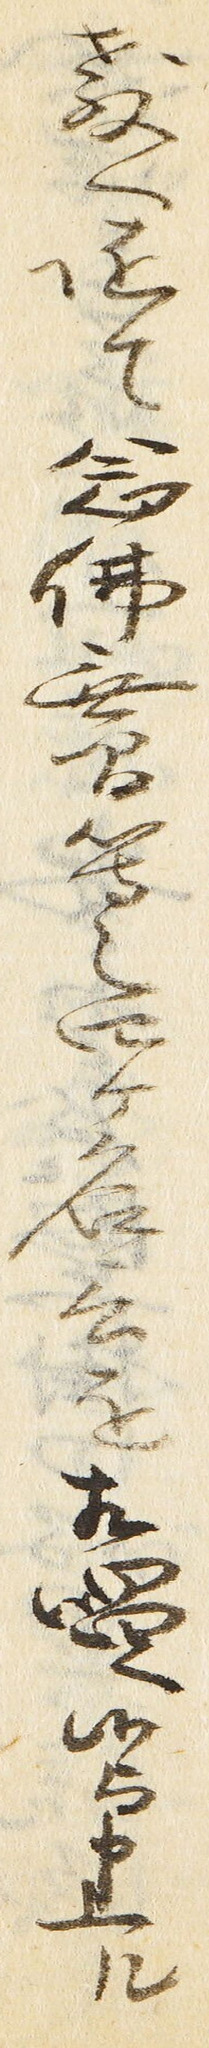教へ随て念佛無間等之四ケ名言を相唱へ候と申上る
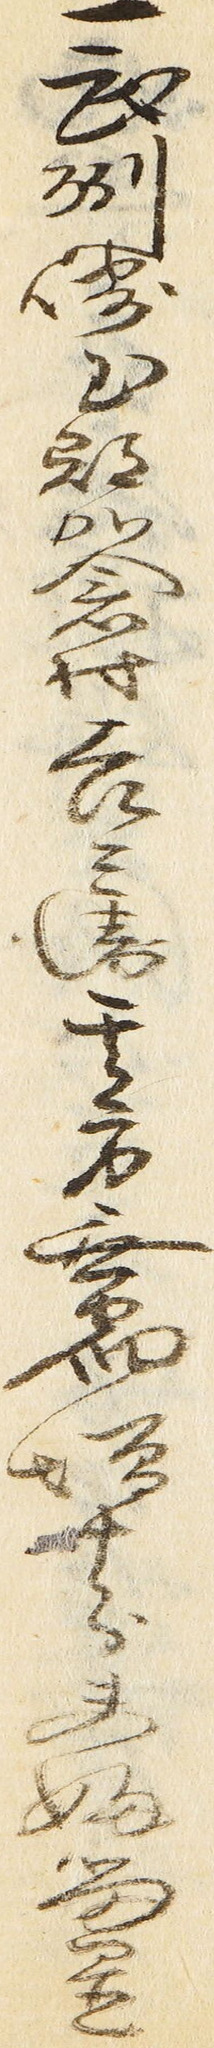一武州埼玉郡加倉村吉兵衛其方無宿増十郎夫婦留置
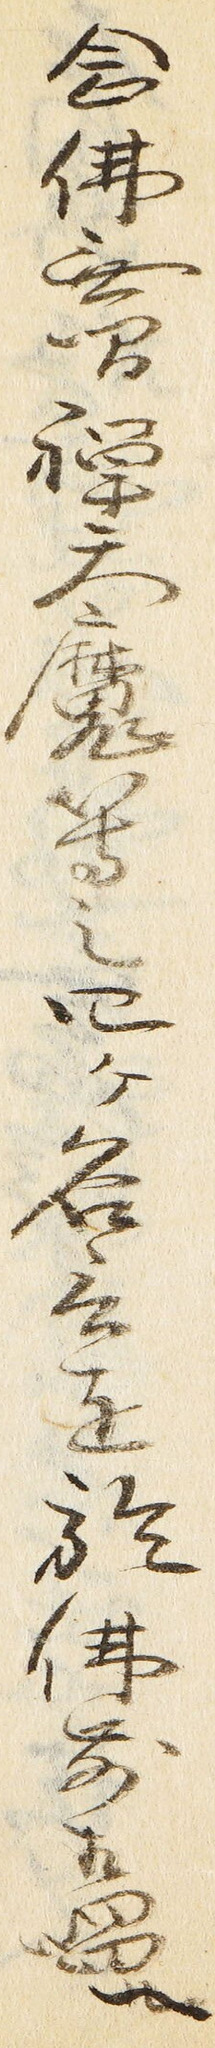念佛無間禅天魔等之四ケ名言を於仏前相唱へ
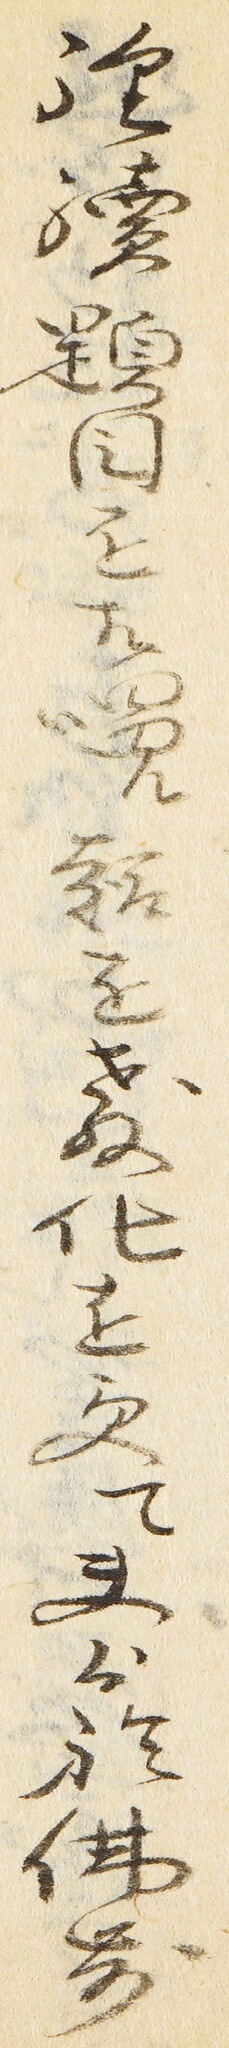経読題目を相唱る趣を教化を受て夫ゟ於仏前
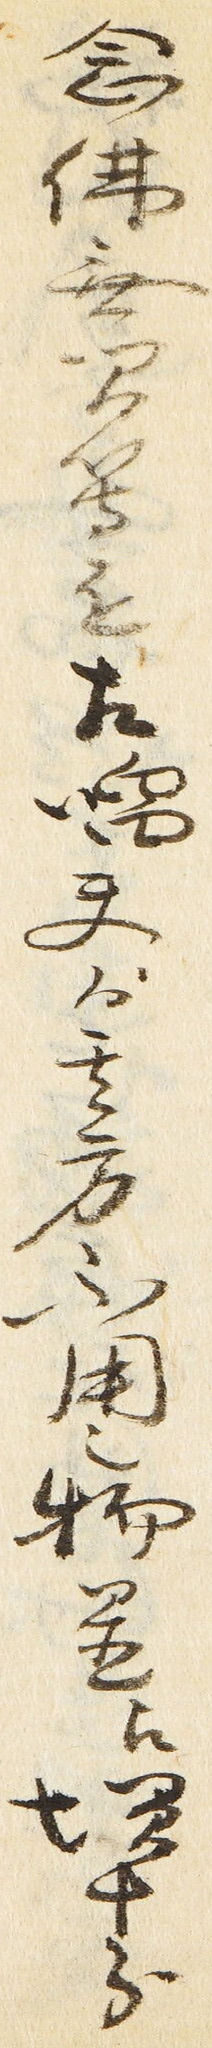念佛無間等を相唱夫ゟ其方不用之物置江増十郎
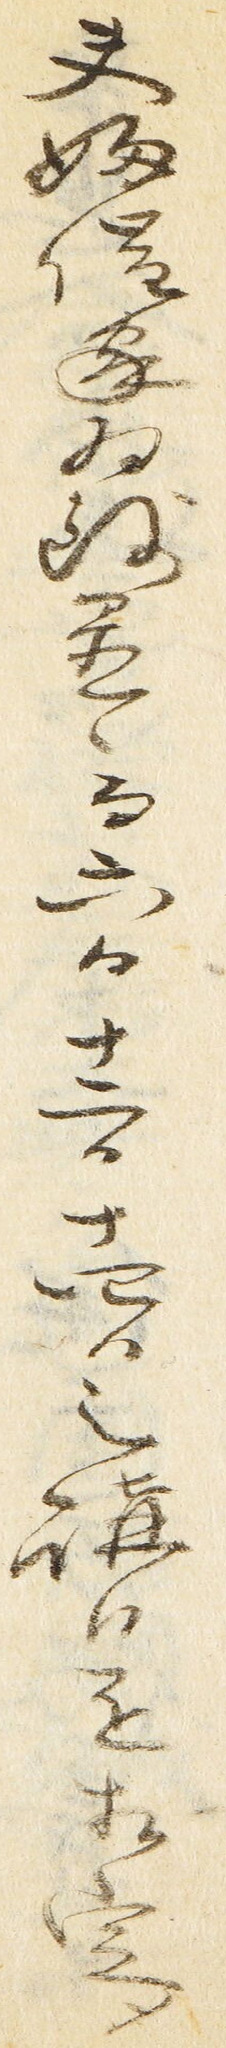夫婦借家為致置候而六日十二日十四日之講日を相定め
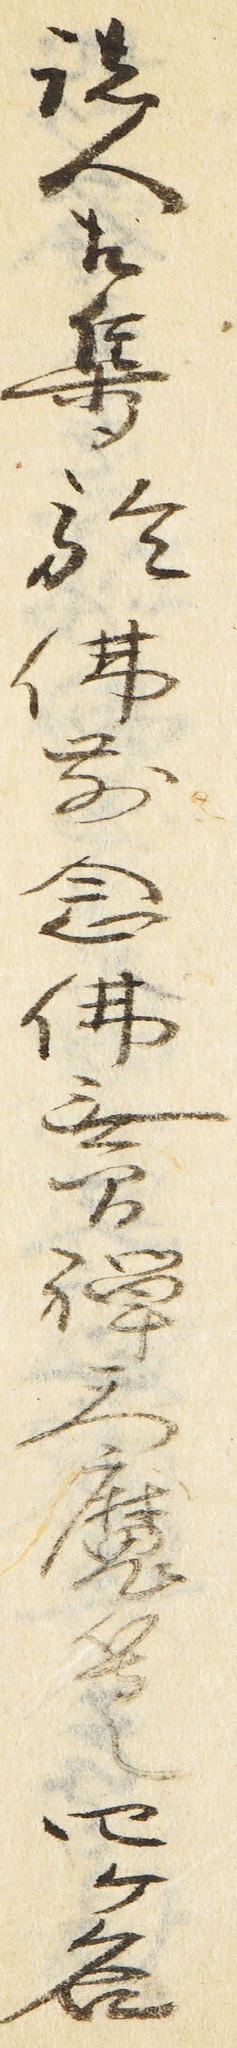諸人相集め於仏前念佛無間禅天魔等之四ケ名
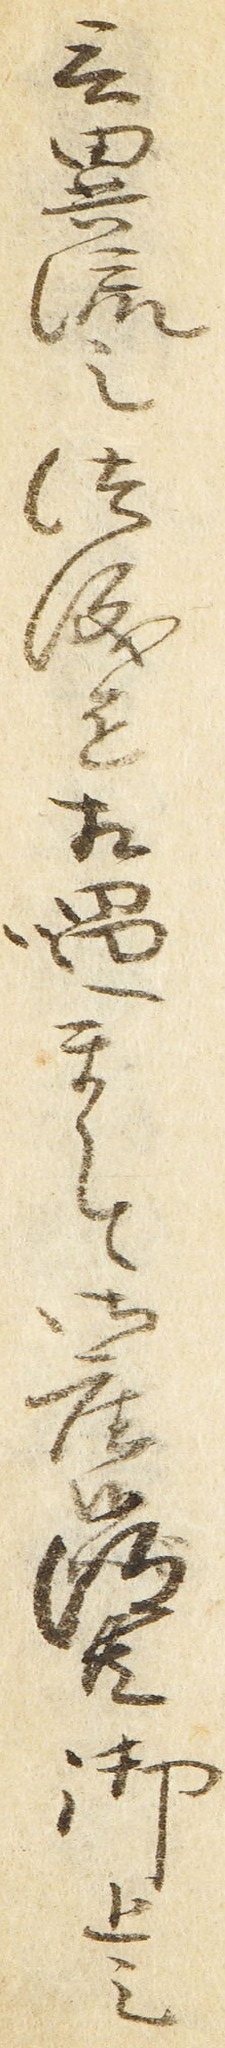言異流之法儀を相唱へまして御座候得共御上之

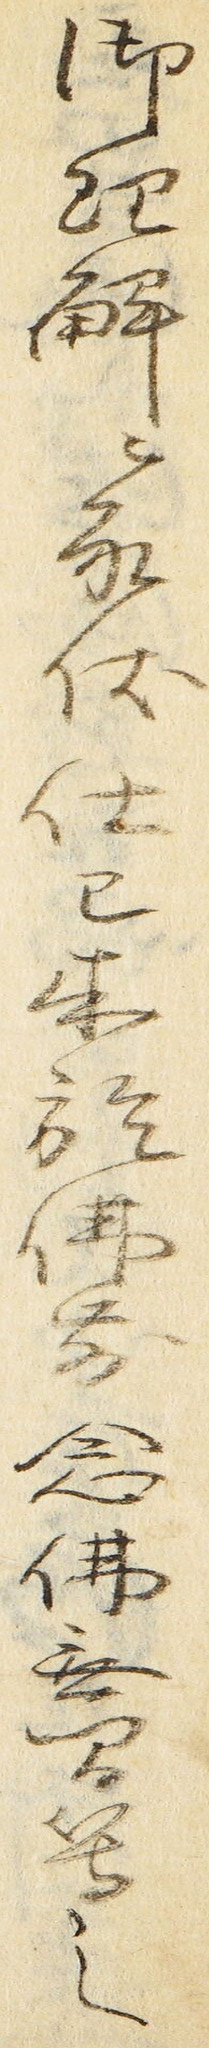御理解に承伏仕已来於仏前念佛無間等之
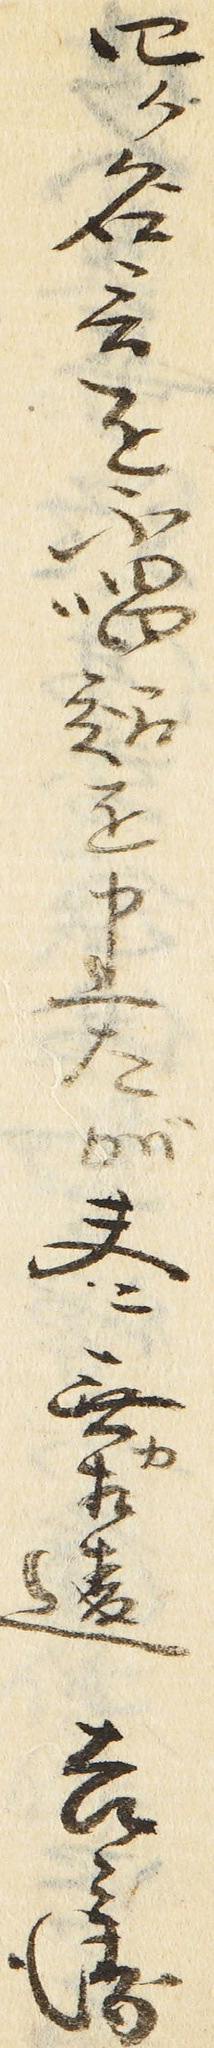四ケ名言を不唱趣を申上たが夫に無カ相違吉兵衛
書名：異流一件日記
